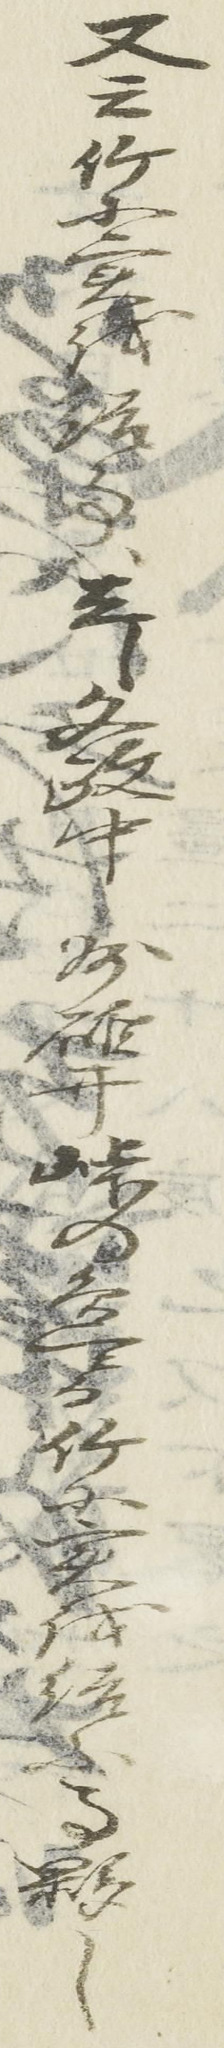又云竹に実を結事ハ去し文政中州碓井峠の辺ニ而竹に実を結ふ事夥し
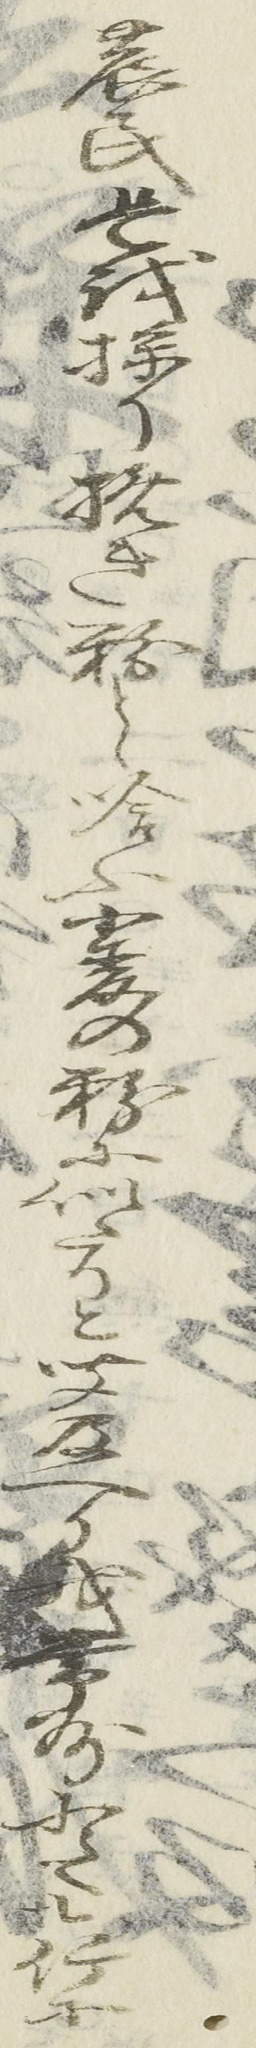農民是を採り挽き粉とし喰ふ小麦の粉に似たりと聞及へり我常州にても竹に
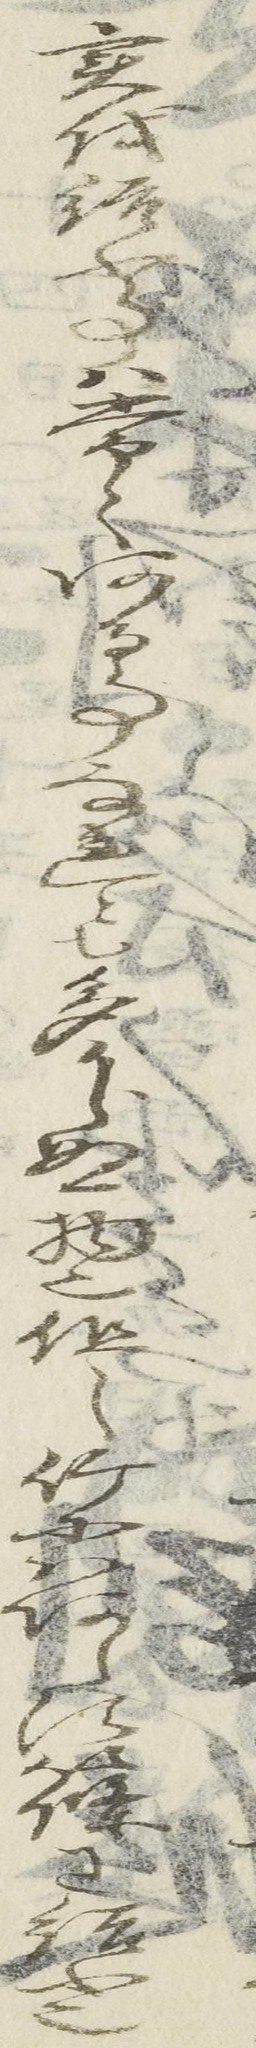実を結ふ事ハ常々ある事なれとも多からぬ物也但し竹にハあらす篠に結ふ也
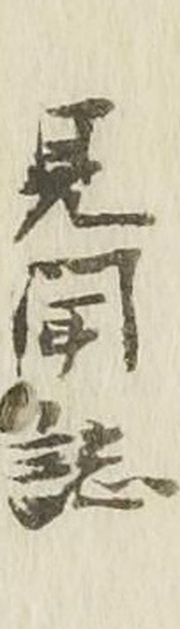見聞誌
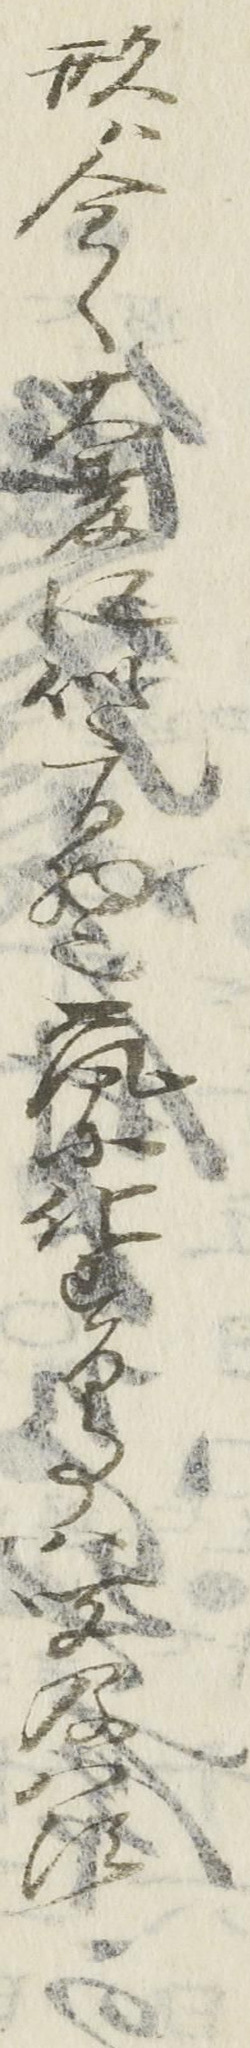形ハ全く大変に似たる物也鼠に化する事ハ聞及はす
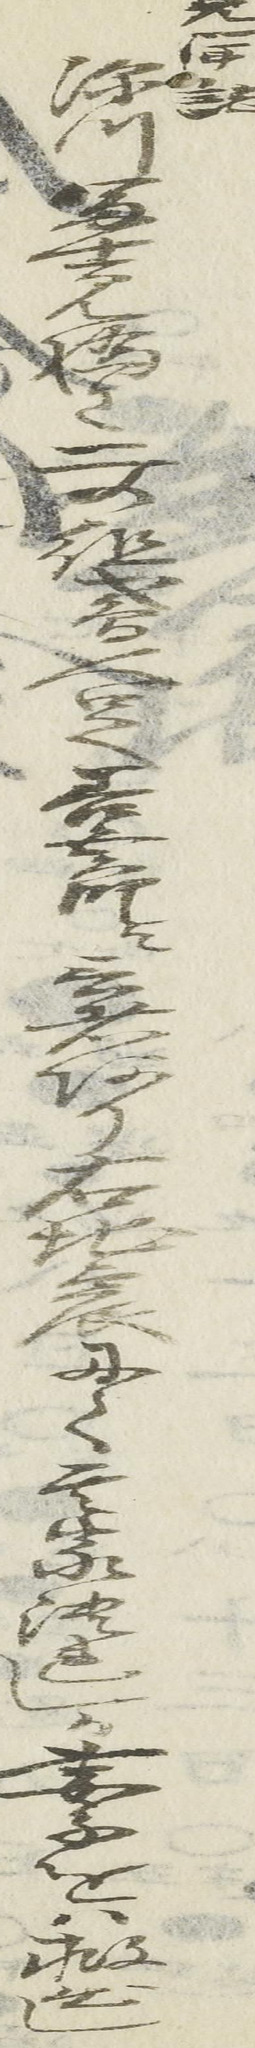一深川富士見橋に二の組鳶人足善五郎と言者あり右地震にて其家潰れしか妻子をハ救出し
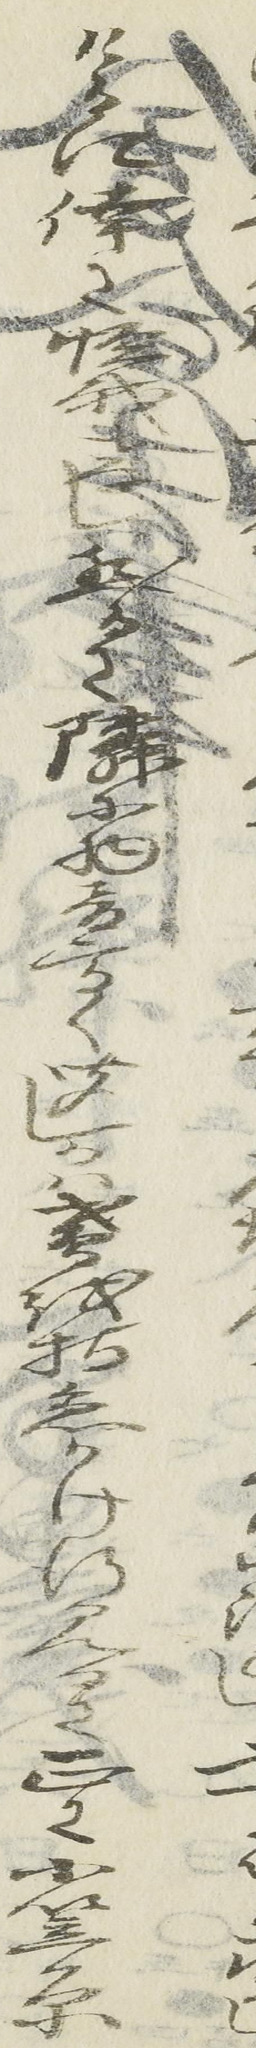けるに倖に怪我もなし然るに隣に物音高く聞しかは鳶を持急かけ行見るに正に小笠原
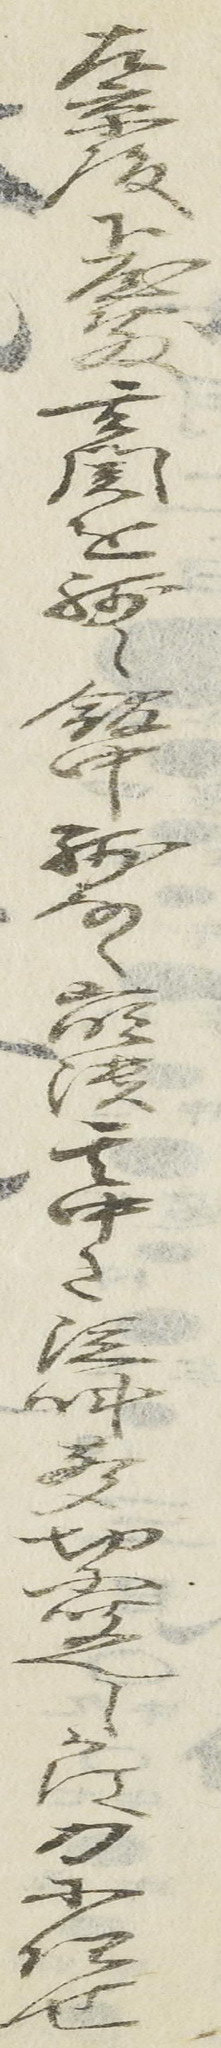左京殿下屋敷玄関を残し館中残なく崩潰其中に泣叫声切に聞へしかは力に任せ
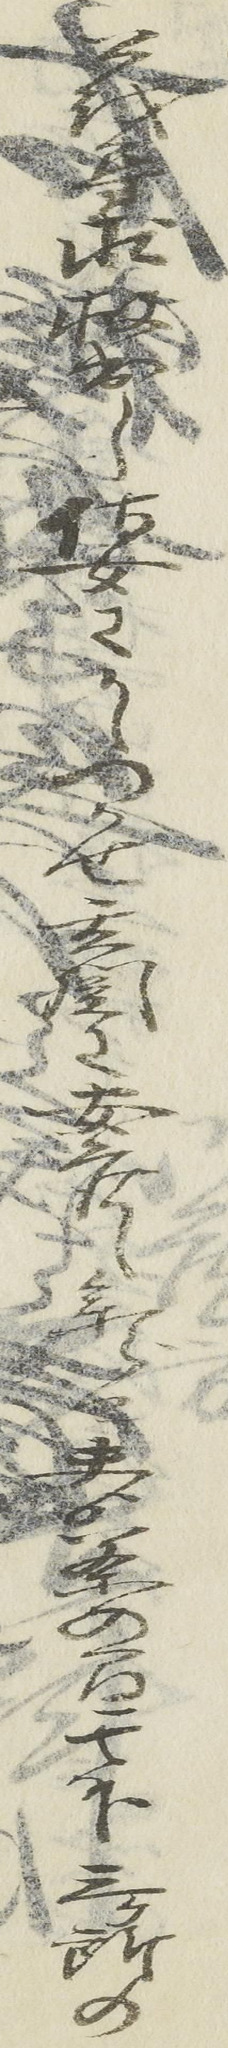公を尋求救出し侍女にかしつかせ玄関に安座し参らる夫ゟ茶の間其外三ケ所の
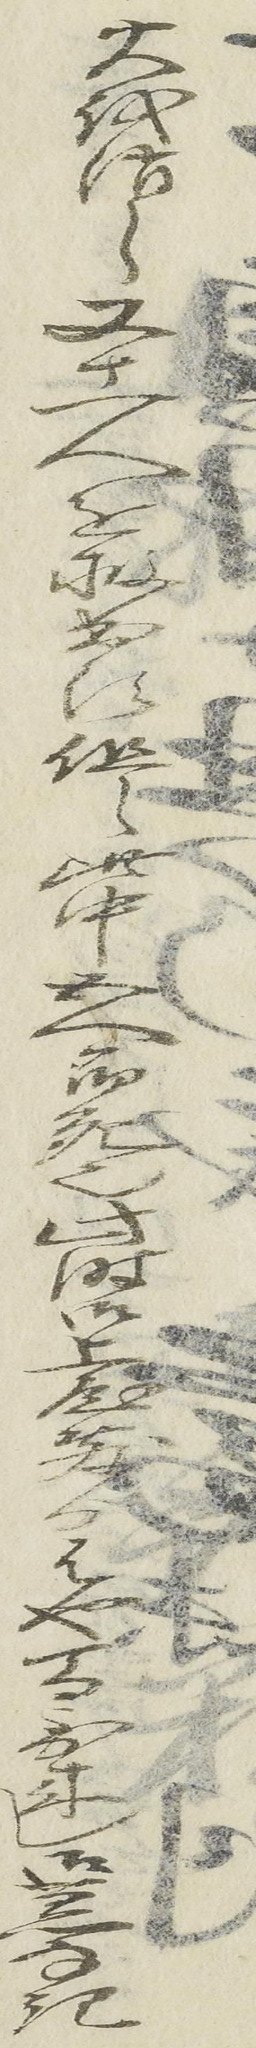火を消し又十一人を救出す但し此中五人即死也此時御上屋敷ゟはや馬到来し御恙なき

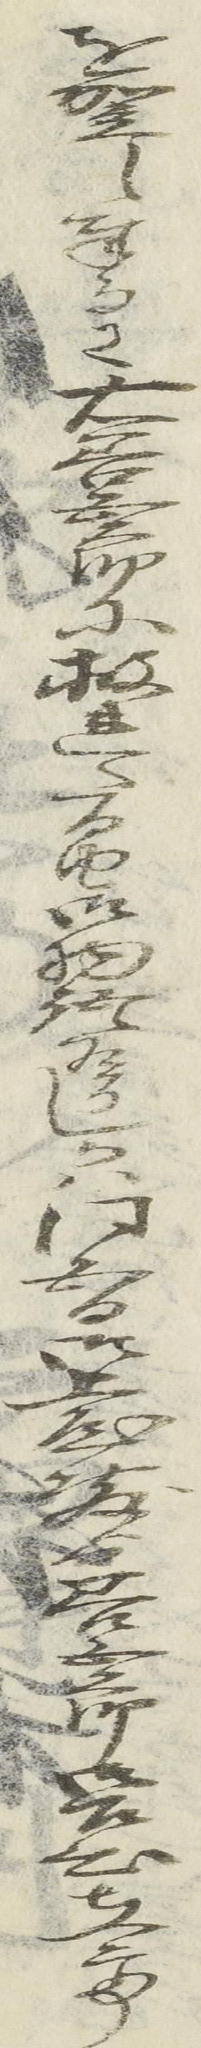を賀し奉るに右善五郎に救れたる由御物語有りしかハ同五日御上屋敷ゟ善五郎御召出支て
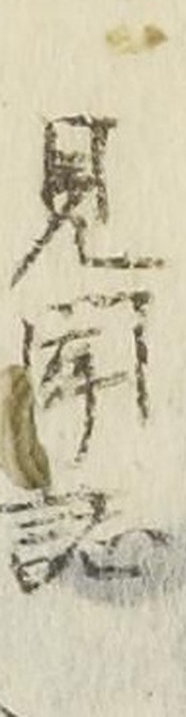見聞誌
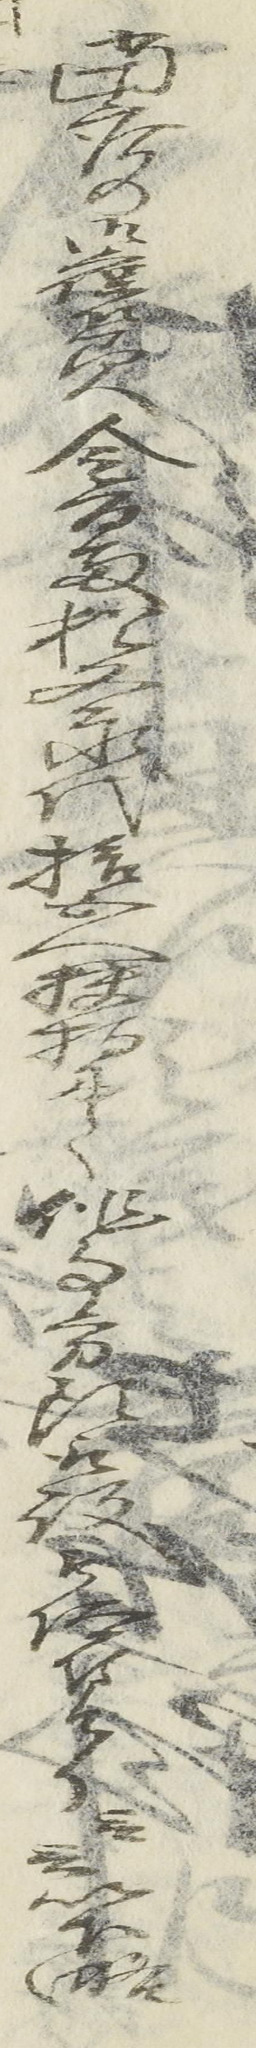当座の御褒美金百両猶又永代拾五人扶持にて作事方頭取役被仰付ケり云云以下略
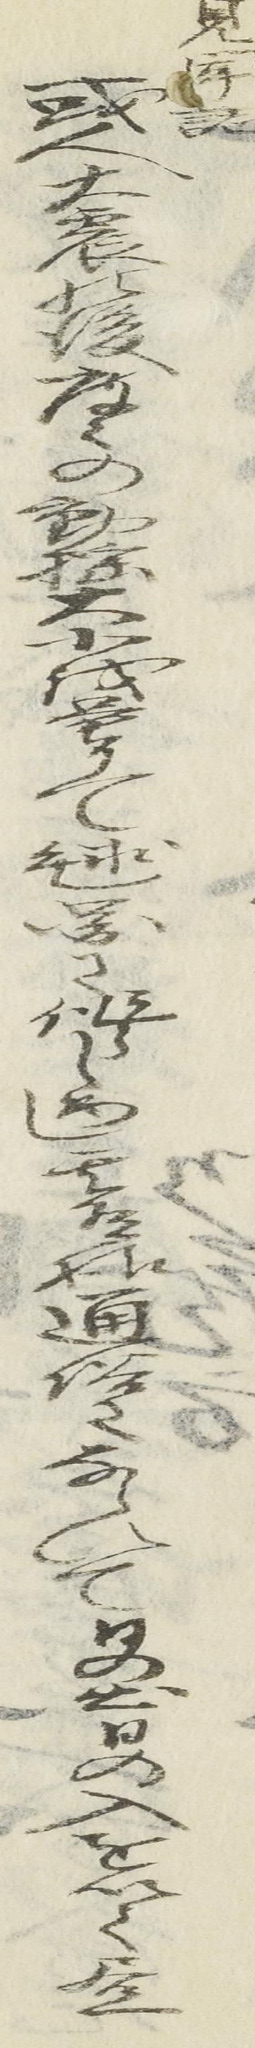一或人大震の後度〻の動揺大小を量りて毬図に作りしめし其有様通俗ニならひて日の出日の入を以て昼
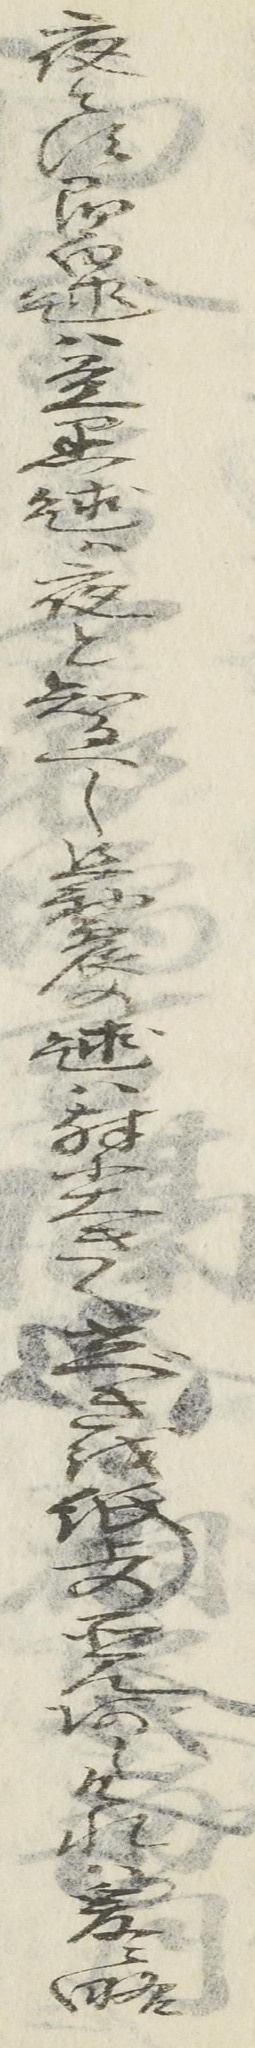夜とす即白毬は昼黒毬は夜と知るへし且初震の毬は殊に大きく書べきを紙上の所見あしけれは爰に略

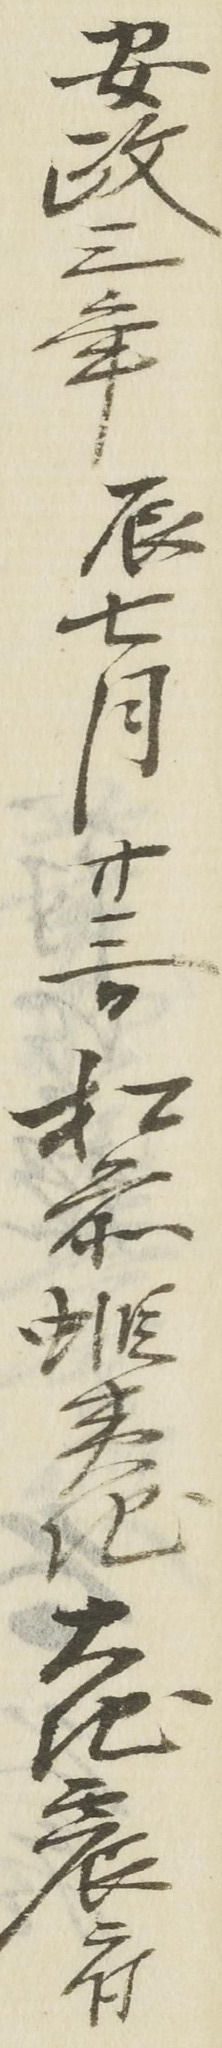安政三年辰七月廿三日松前蝦夷地大地震ニ付
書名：安政乙卯江戸大地震筆記　安政丙辰八月大阪大雷雨之記追加　安政三辰年七月松前辺大地震并八月大風雨記録
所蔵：東京大学地震研究所図書室 Earthquake Research Institute Library, The University of Tokyo, JAPAN
